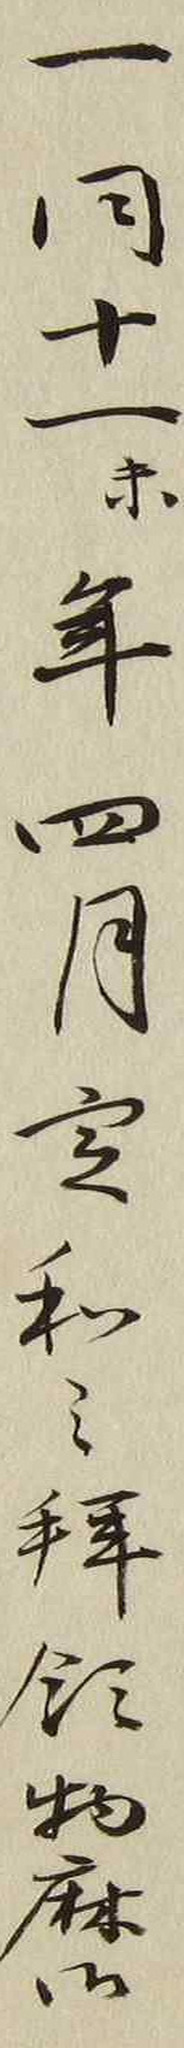一同十一未年四月定和之拝領物麻御
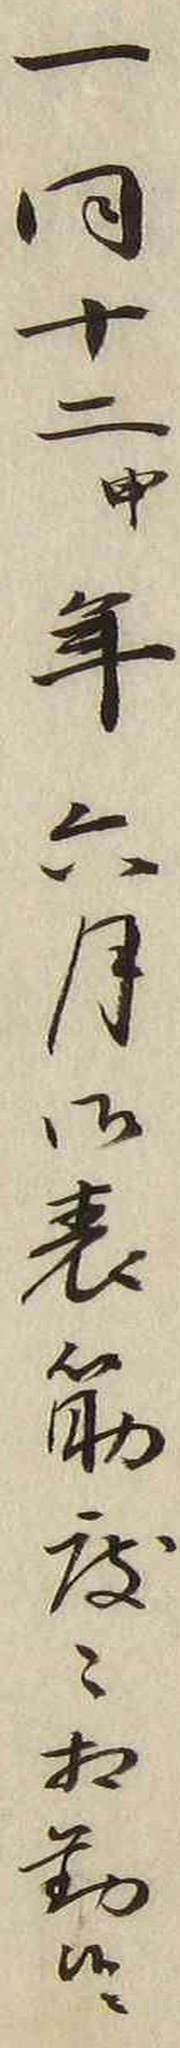一同十二申年六月御表筋度々相勤め候ニ

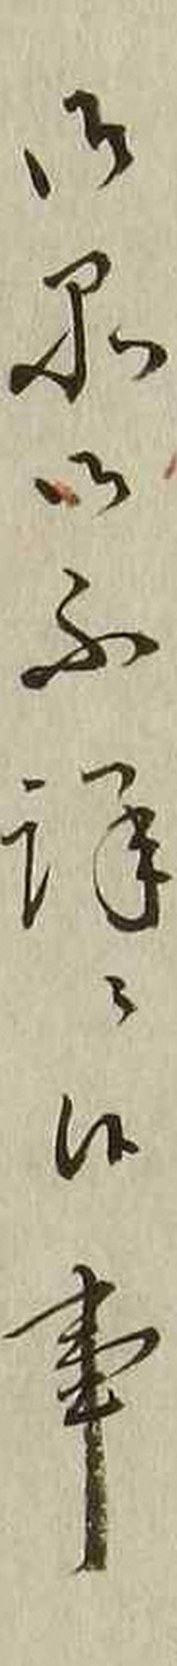御品御不詳ニ候事
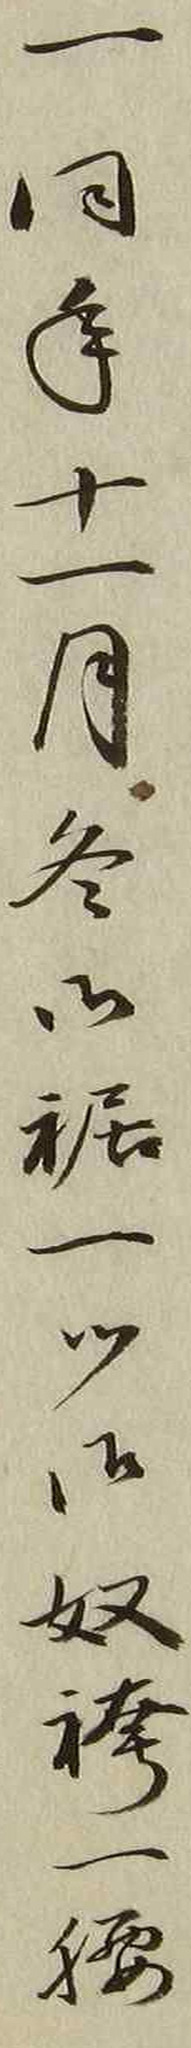一同年十一月冬御裾一ツ御奴袴一腰
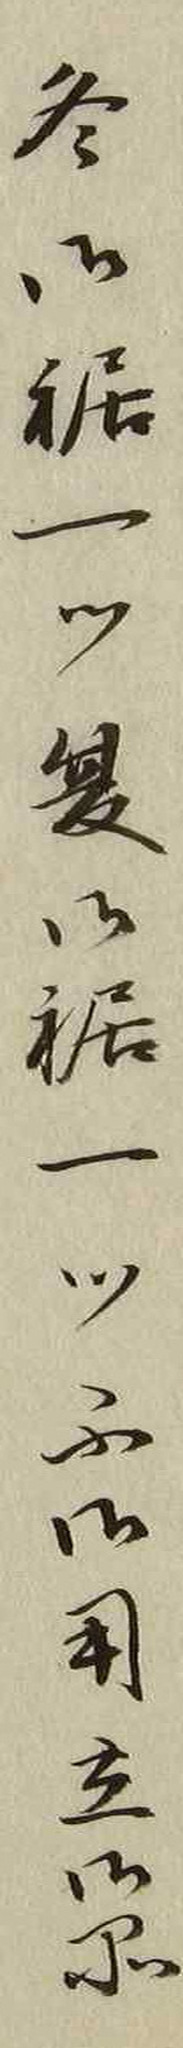冬御裾一ツ夏御裾一ツふ御用立御品
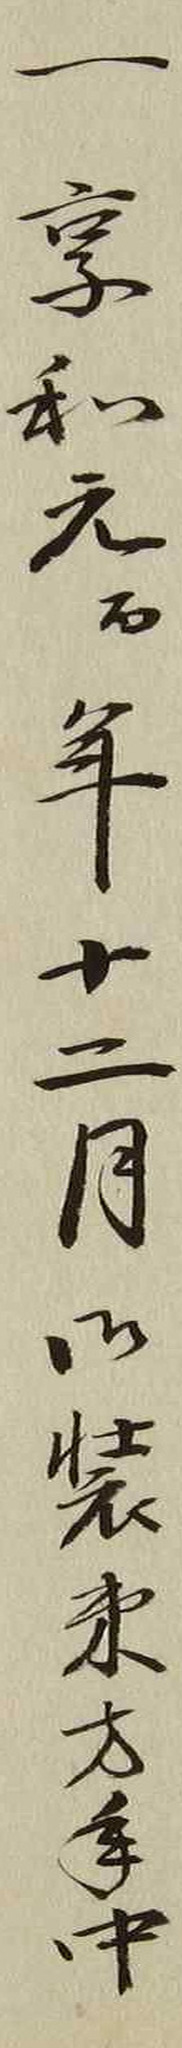一享和元酉年十二月こ御装束方年中
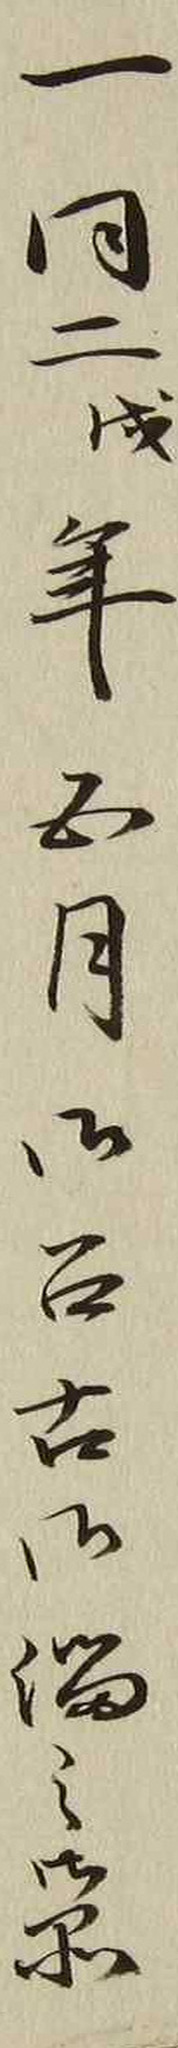一同二戌年五月御召し古御偽之御品
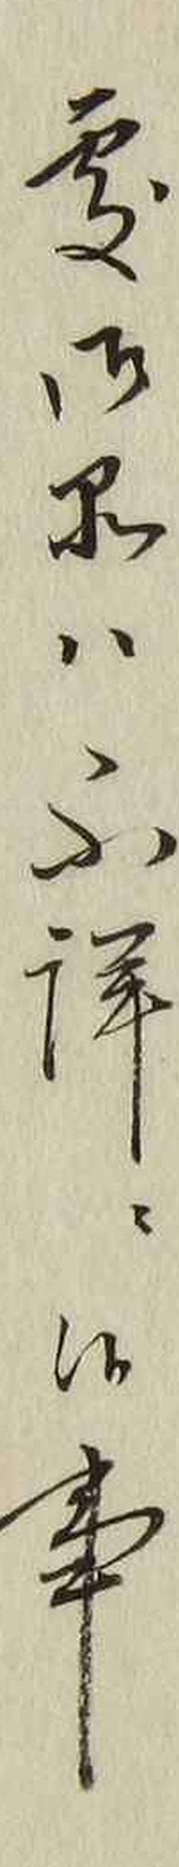処御品ハ不詳ニ候事
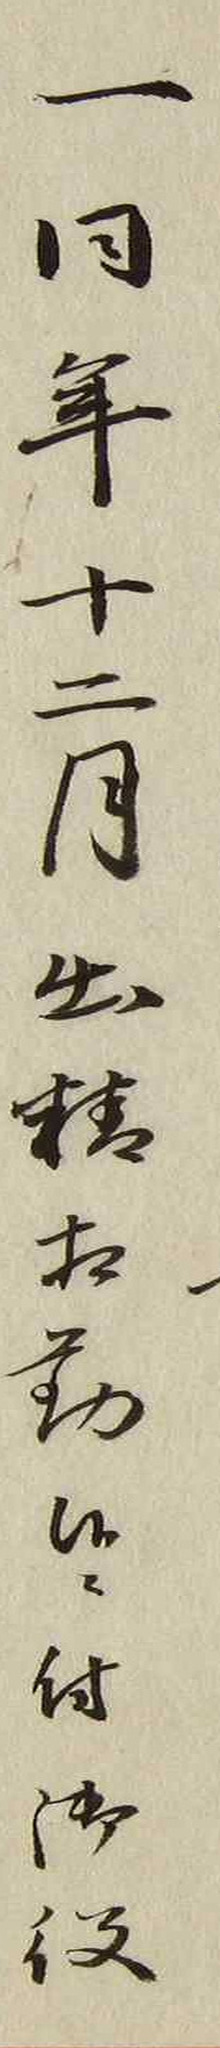一同年十二月出精相勤め候ニ付御役
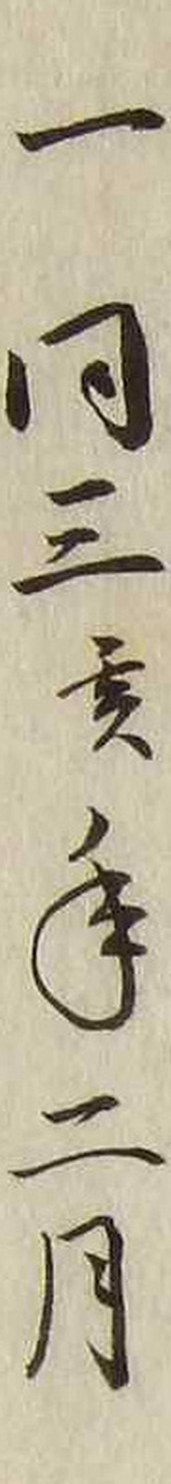一同三把亥年二月

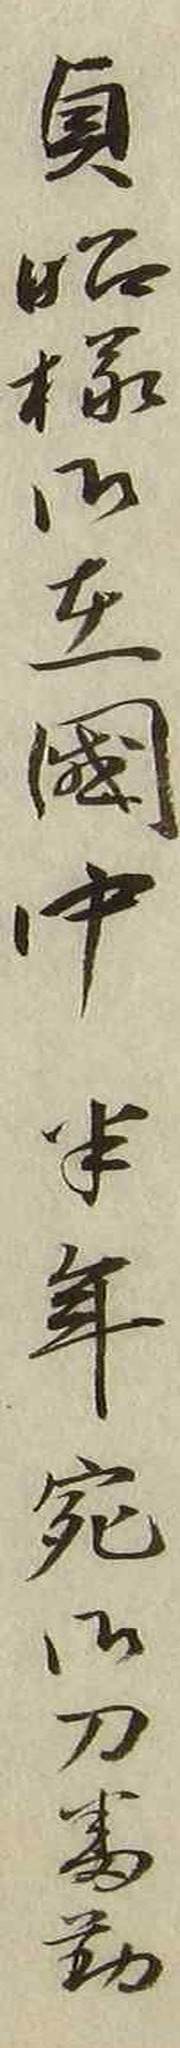貞昭様御在国中半年宛御刀番勤め
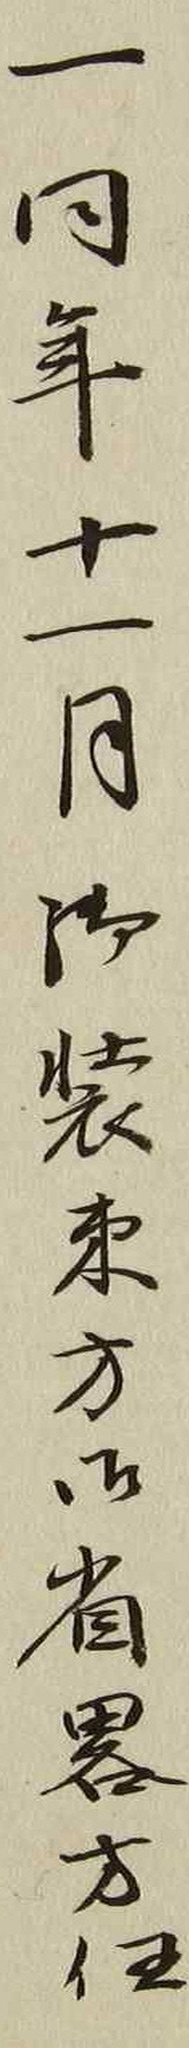一同年十一月御装束方御省略方任せ
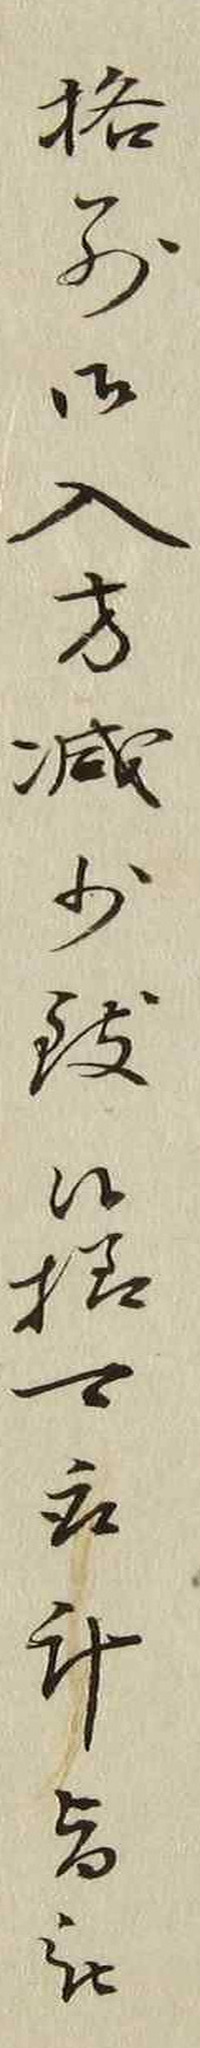格別御入方減少致し候様取計う旨
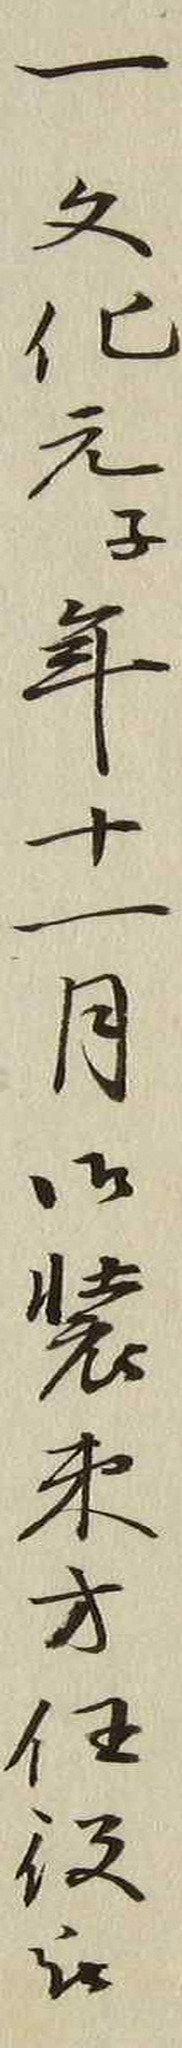一文化元子年十一月御装束方任せ役
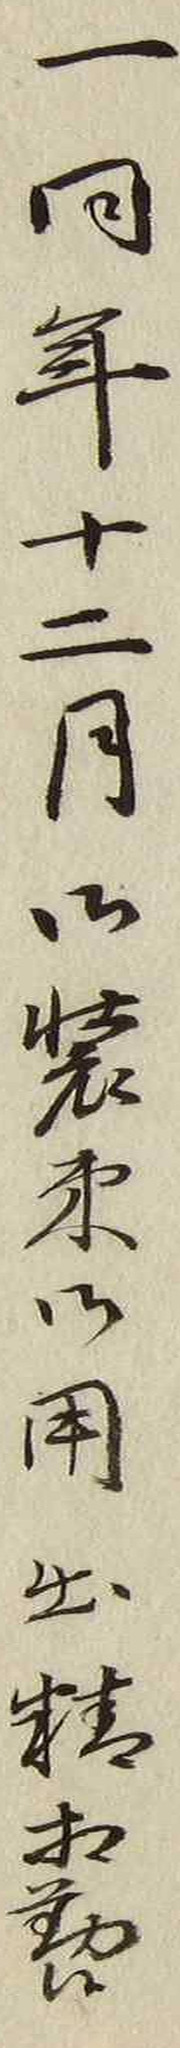一同年十二御装束御用出精相勤め候
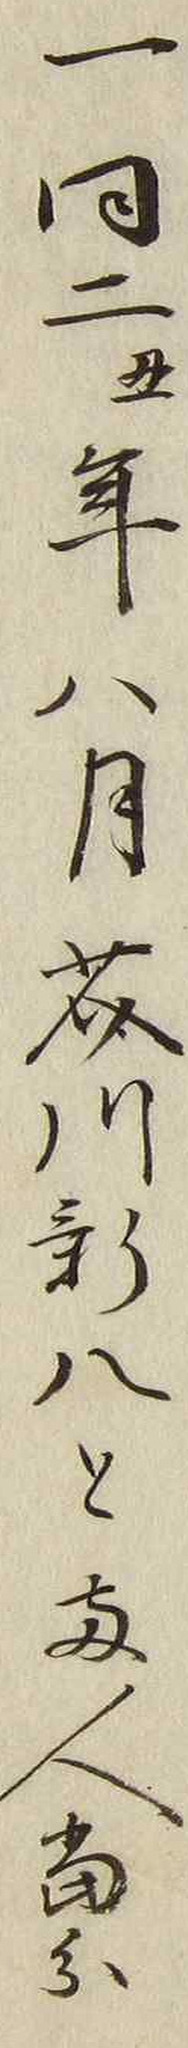一同二丑年八月芥川新八と両人当分
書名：諸士系譜　巻之19　い之部19
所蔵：会津若松市立会津図書館
